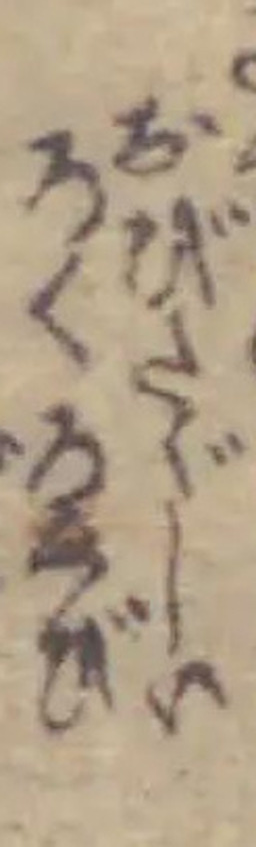ろくろくび
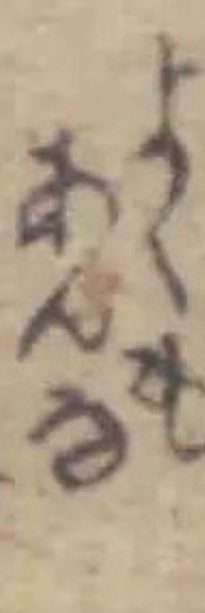あんな
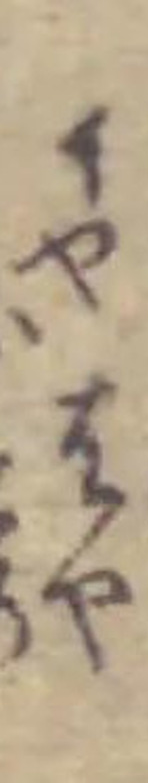イヤはや
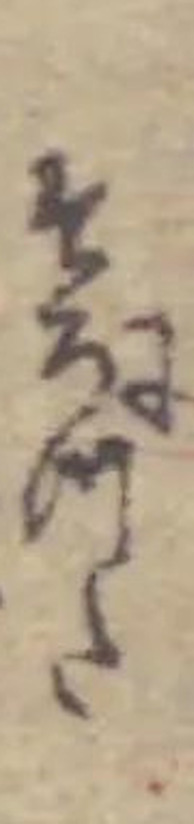そろつた
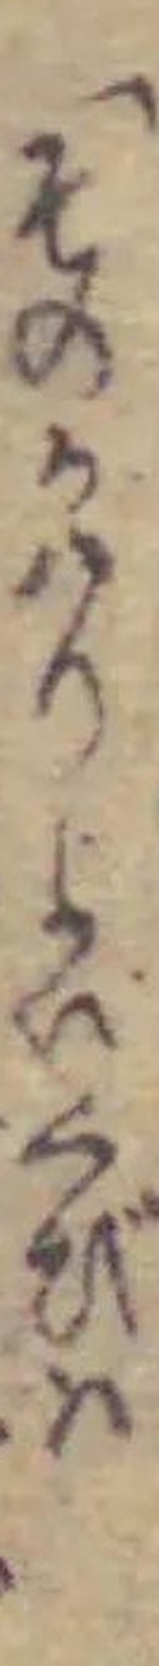〽そのかはりよいくびは
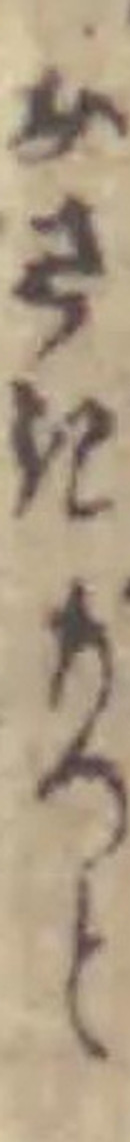おさきもつと
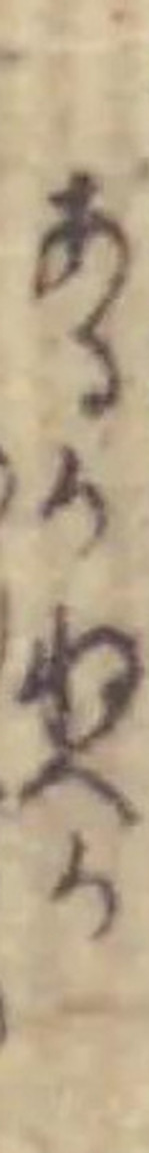あるかねへか
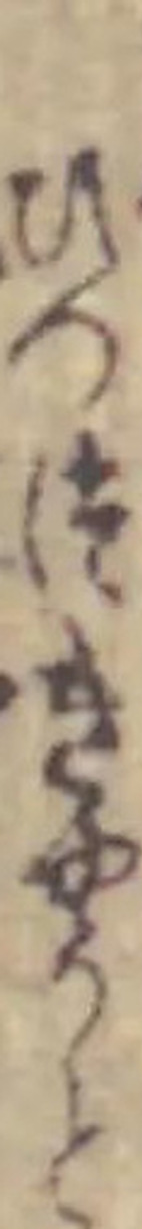ひつつきやうと
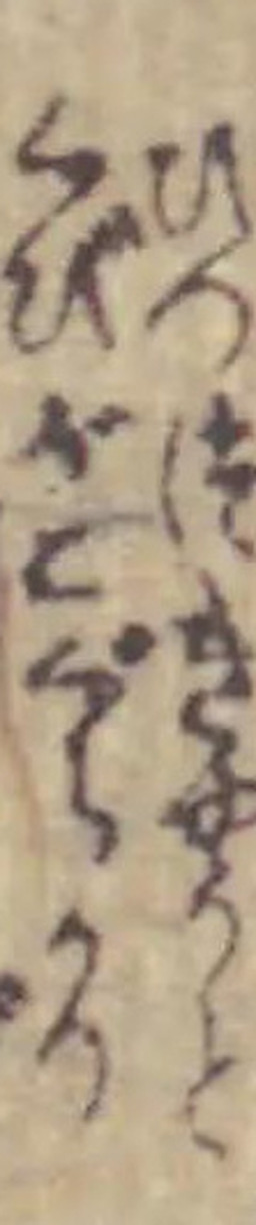くびがこぐらかり
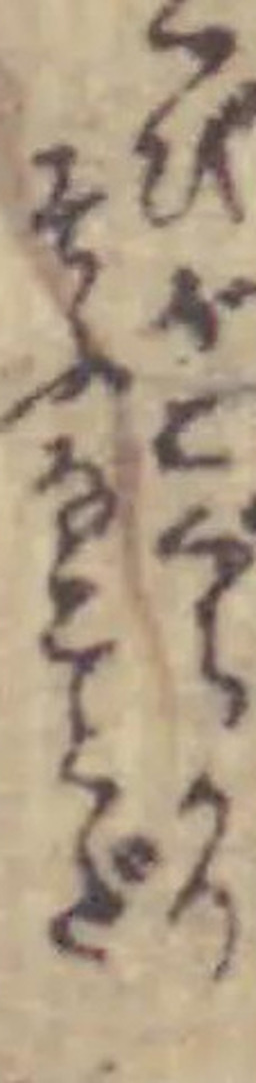そふなことだ
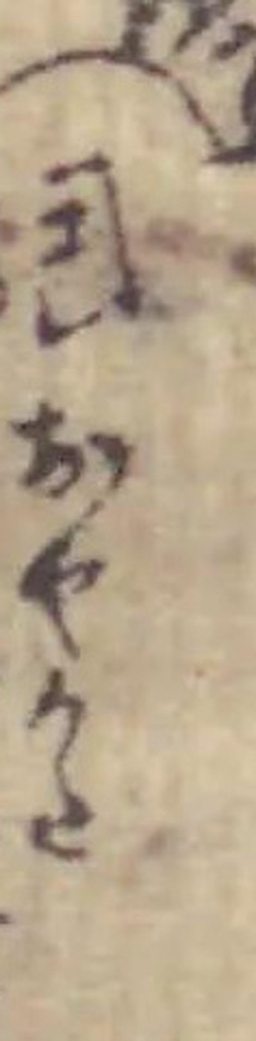〽コレおやかた
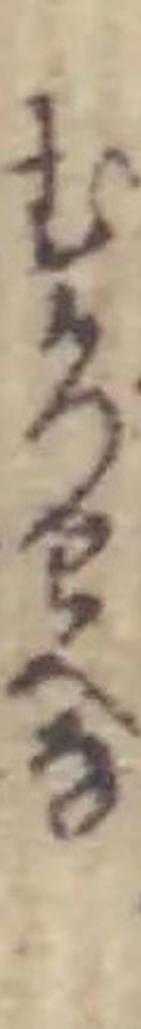むかつセへな
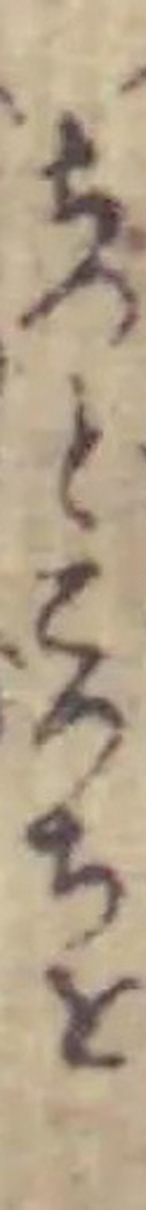ちつとこつちを
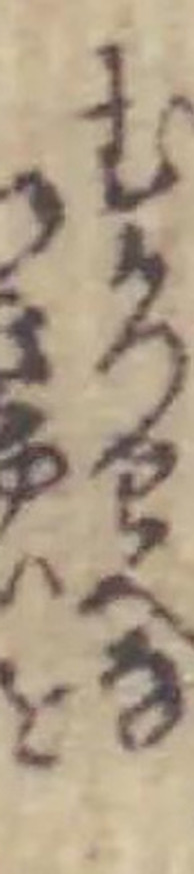むかつセへな
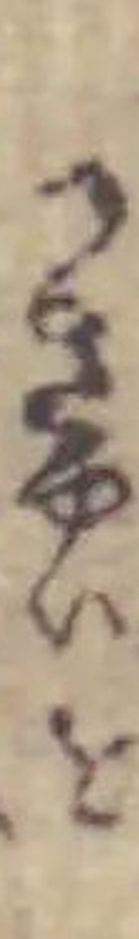つきやいを
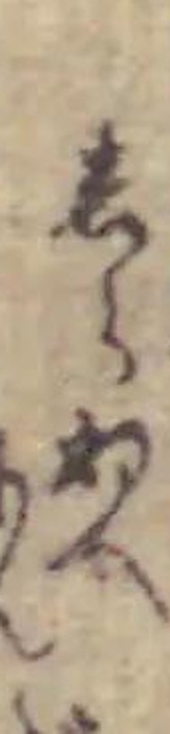しらねへ
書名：化物太平記 3巻
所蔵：国立国会図書館 National Diet Library, JAPAN
